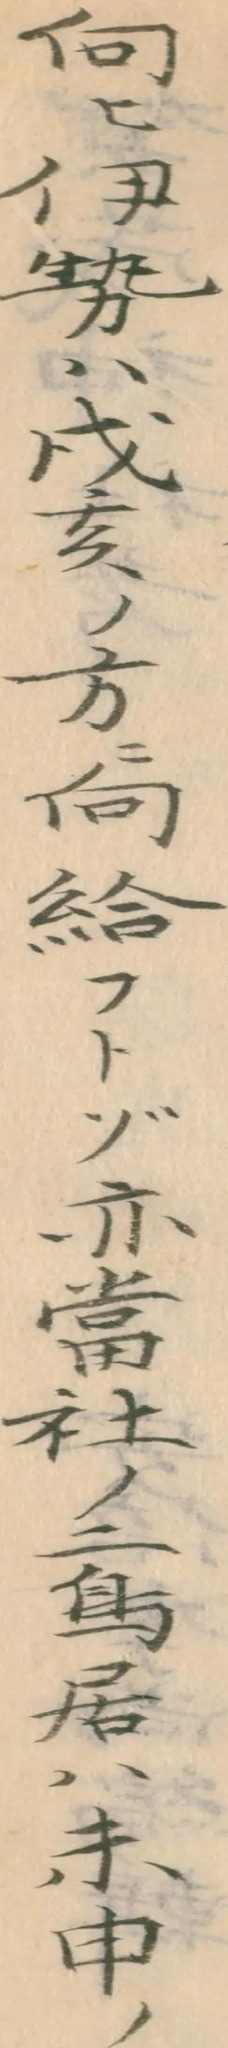向ヒ伊勢ハ戌亥ノ方ニ向給フトゾ亦当社ノ二鳥居ハ未申ノ
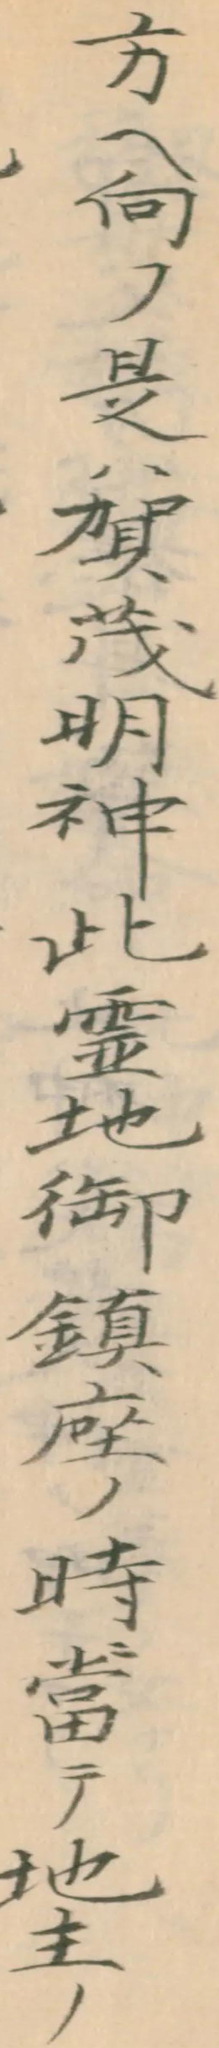方へ向フ是ハ賀茂明神此霊地御鎮座ノ時ニ当テ地主ノ
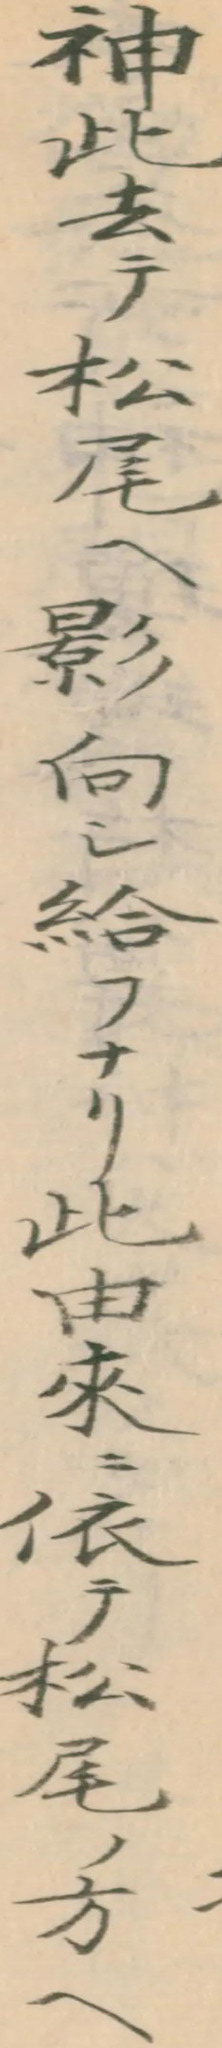神此去テ松尾へ影向シ給フナリ此由来ニ依テ松尾ノ方ヘ
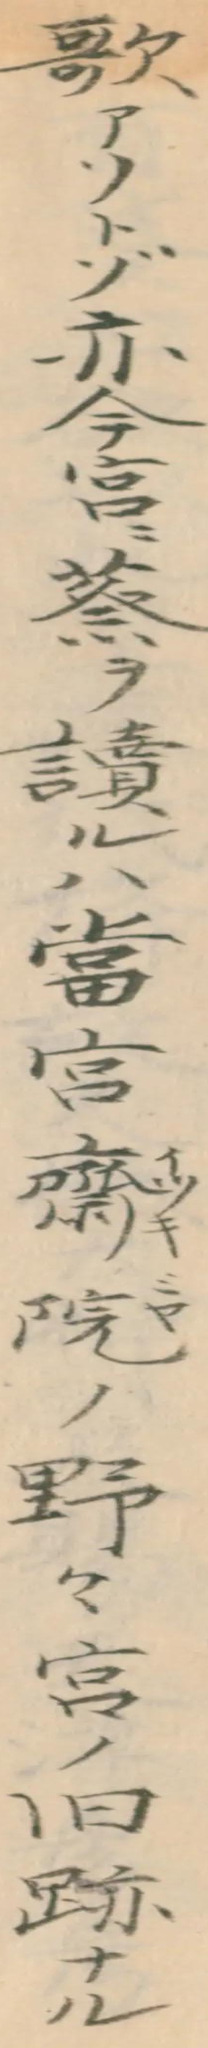歌アリトゾ亦今宮ニ葵ヲ読ルハ当宮斎院ノ野々宮ノ旧跡ナル
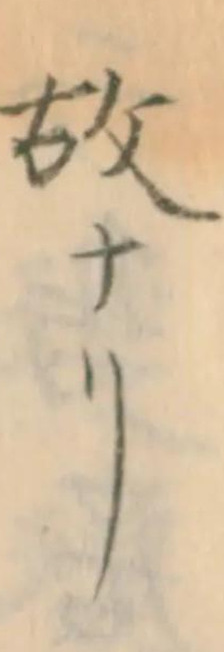故ナリ
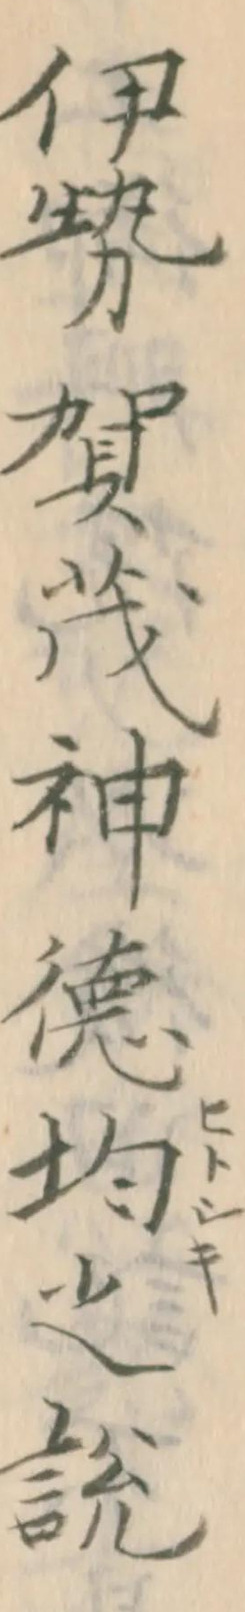伊勢賀茂神徳均之説
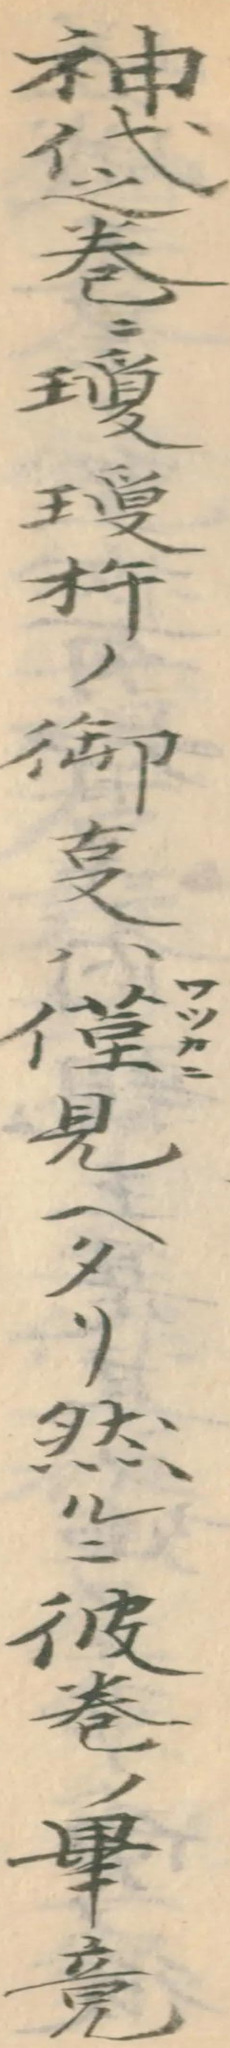神代之巻ニ瓊瓊杵ノ御事ハ僅見ヘタリ然ルニ彼巻ノ畢竟
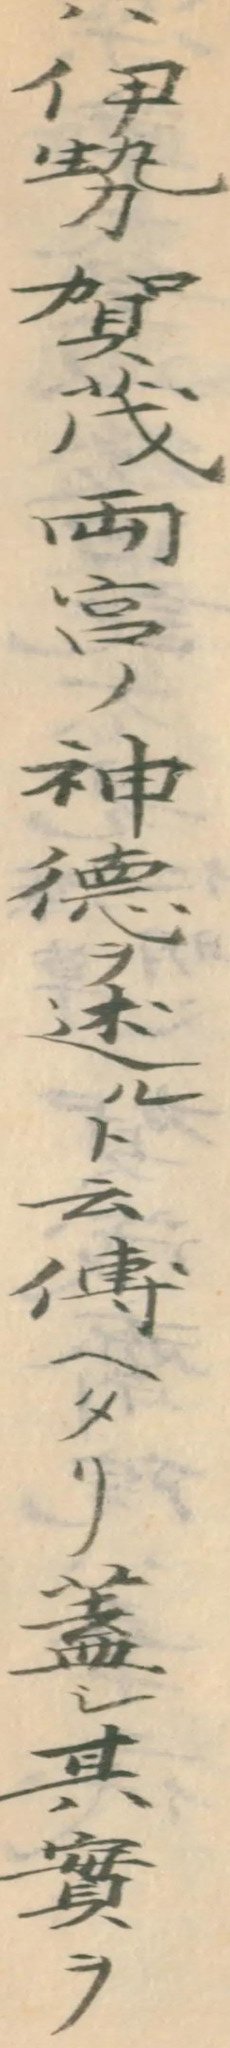ハ伊勢賀茂両宮ノ神徳ヲ述ルト云伝ヘタリ蓋シ其実ヲ
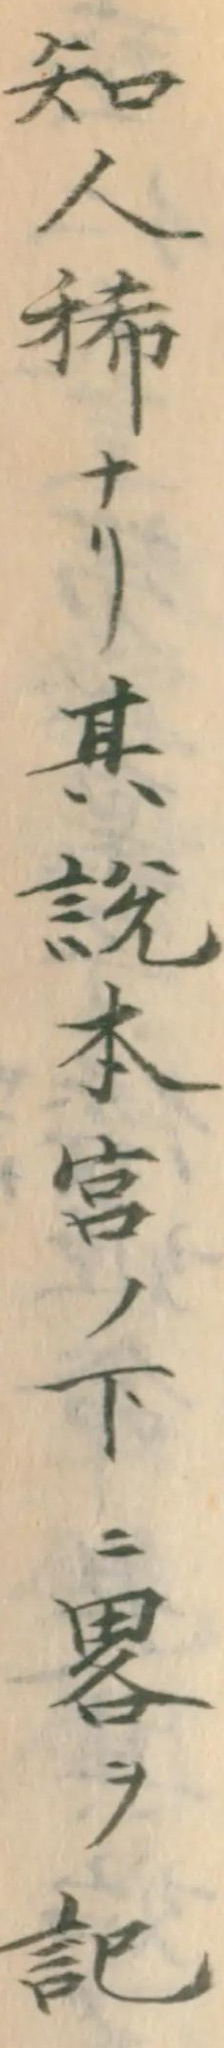知人稀ナリ其説本宮ノ下ニ略ヲ記
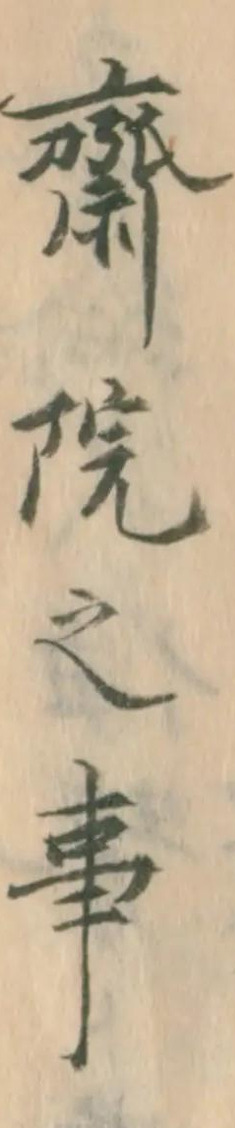斎院之事

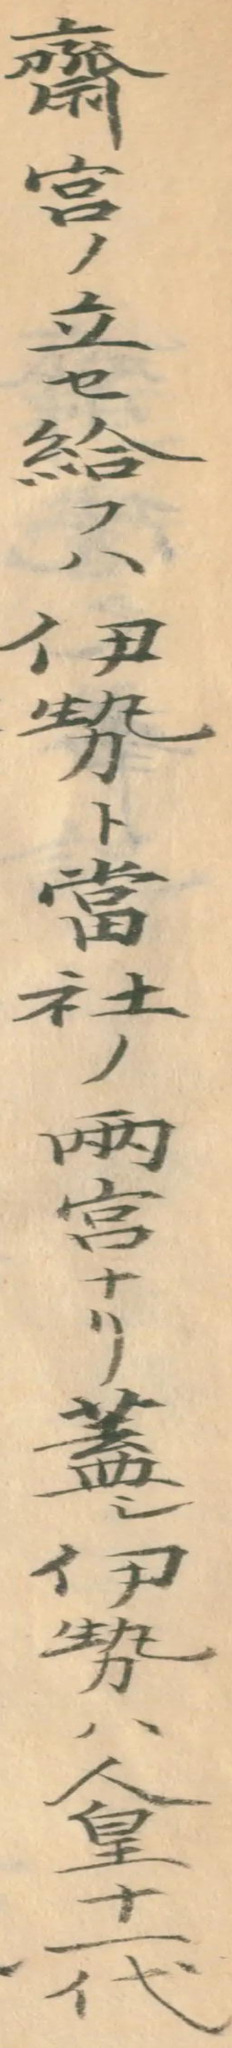斎宮ノ立セ給フハ伊勢ト当社ノ両宮ナリ蓋シ伊勢ハ人皇十一代
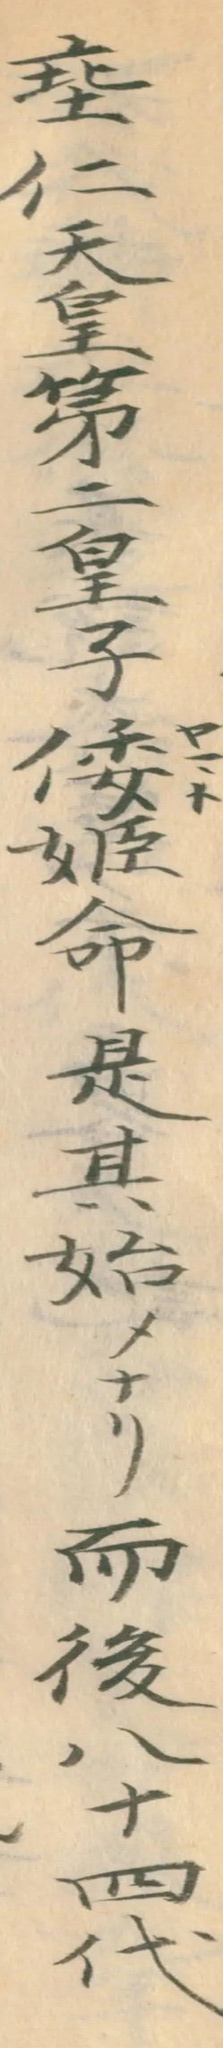垂仁天皇第二皇子倭姫命是其始メナリ而後八十四代
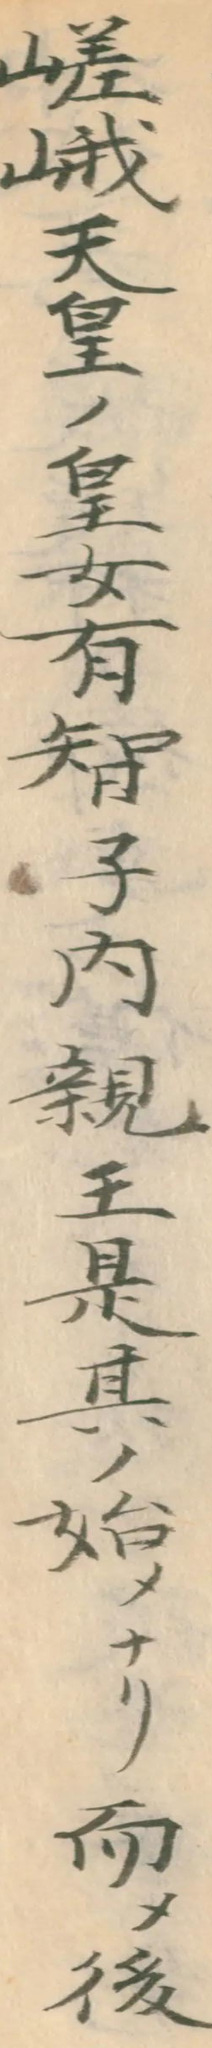嵯峨天皇ノ皇女有智子内親王是其ノ始メナリ而シテ後
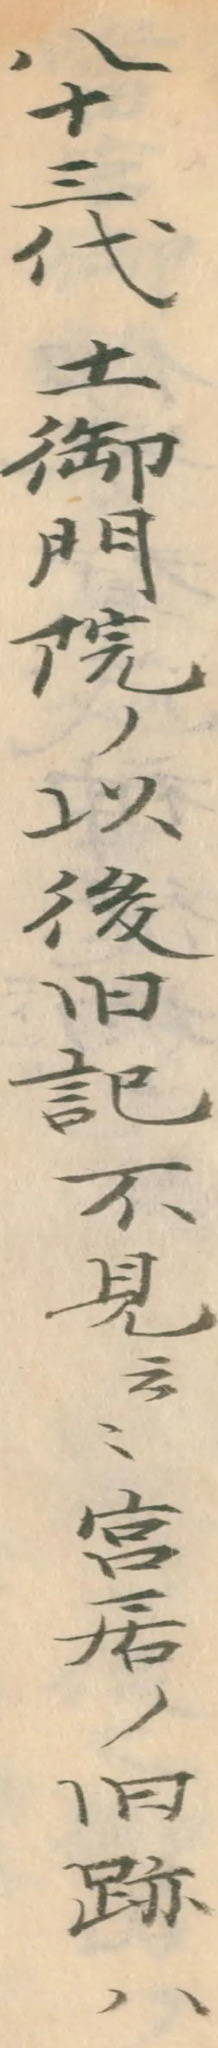八十三代土御門院ノ以後旧記不見云々宮居ノ旧跡ハ
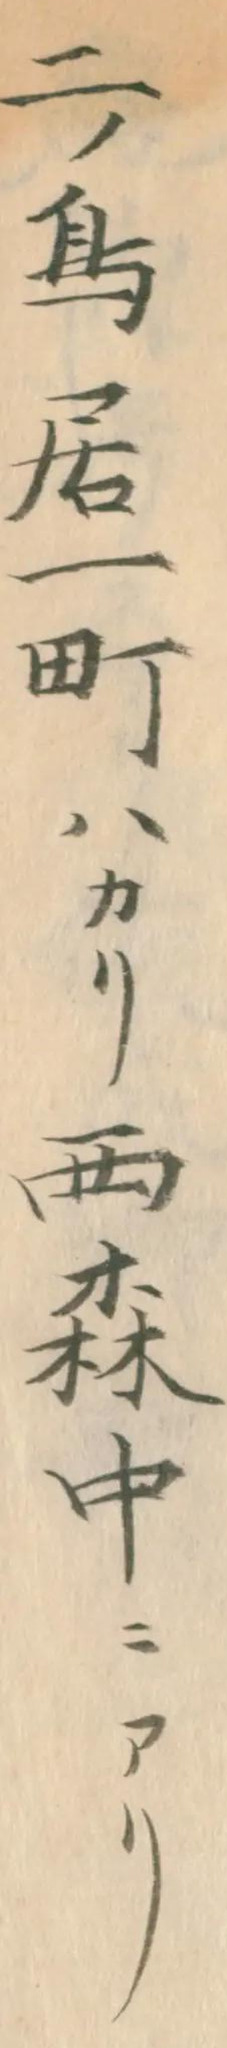二ノ鳥居一町ハカリ西森中ニアリ
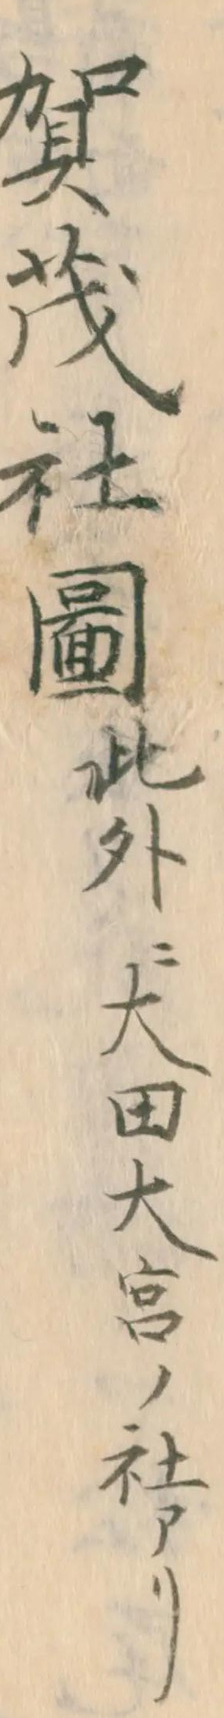賀茂社図此外ニ大田大宮ノ社アリ
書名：賀茂社記録. 第91冊
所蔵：国立国会図書館 National Diet Library, JAPAN
